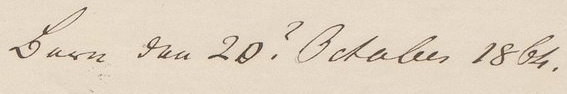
Bern den 20t October 1864.
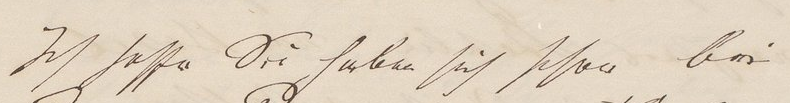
Ich hoffe Sie haben sich schon bei
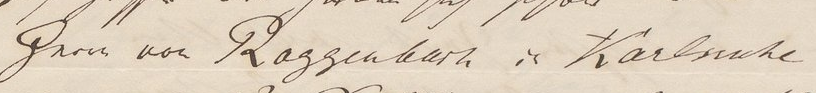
Herrn von Roggenbach in Karlsruhe
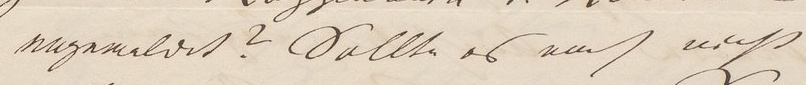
angemeldet? Sollte es noch nicht
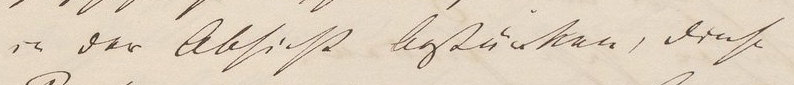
in der Absicht bestärken, diese
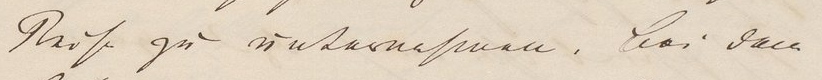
Reise zu unternehmen. Bei dem
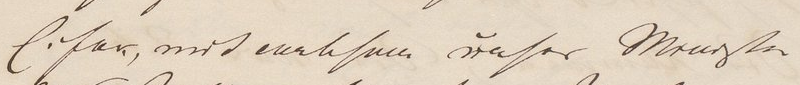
Eifer, mit welchem unser Minister
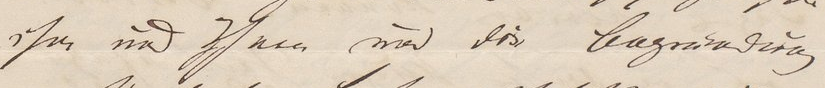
ihm und Ihnen und die Begründung
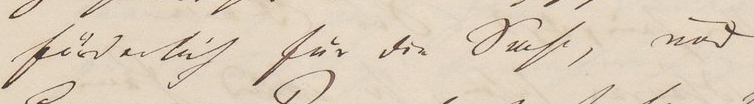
förderlich für die Sache, und
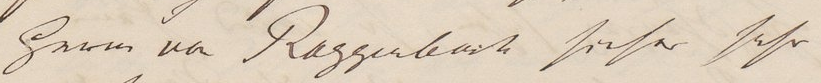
Herrn von Roggenbach sicher sehr
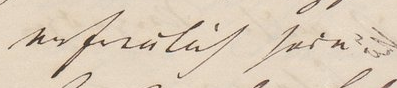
erfreulich sein.
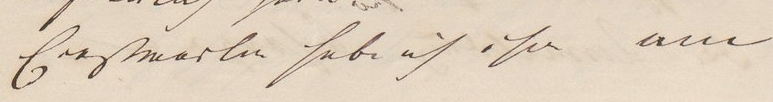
Einstweilen habe ich ihn am
